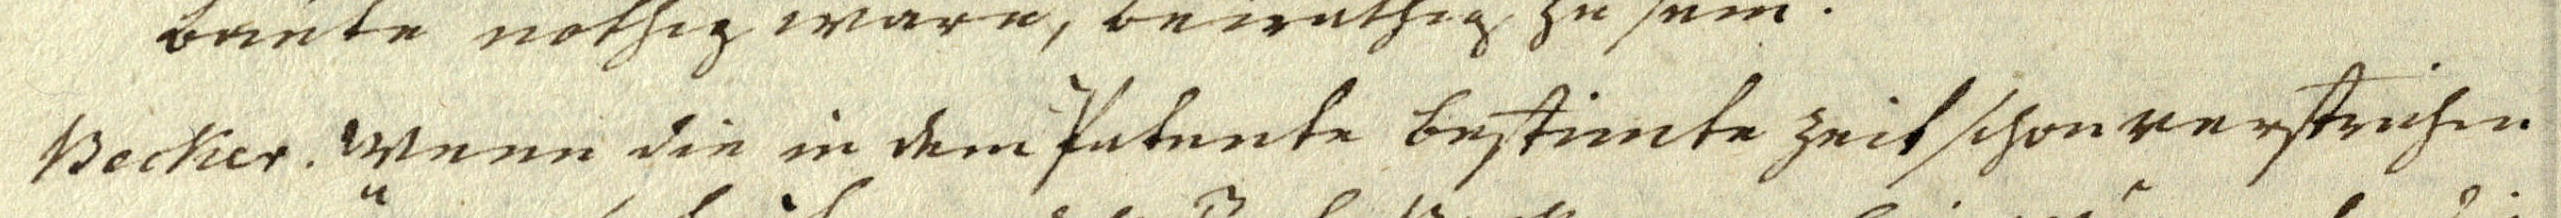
Becker. Wenn die in dem Patente bestimte Zeit schon verstrichen
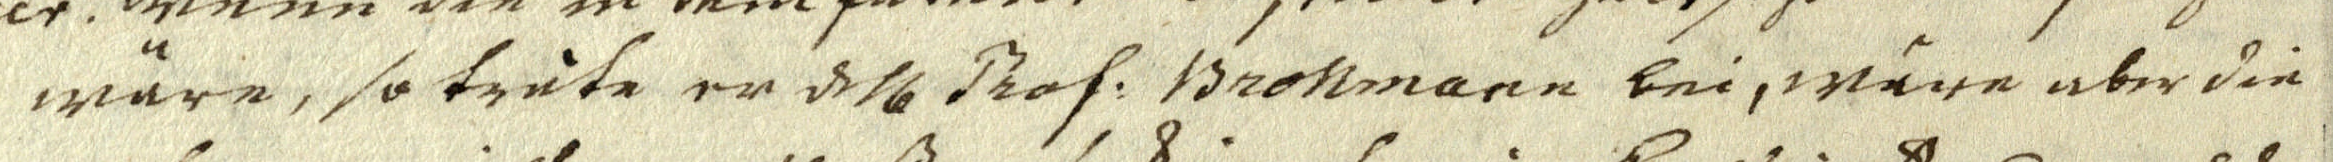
wäre, so träte er dh Prof.: Brokmann bei, wäre aber die
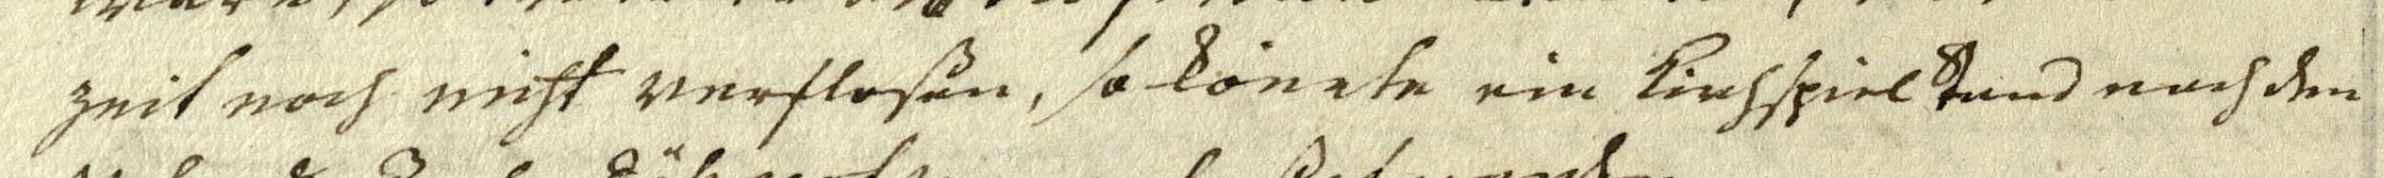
Zeit noch nicht verfloßen, so könnte ein KirchspielStand nach dem
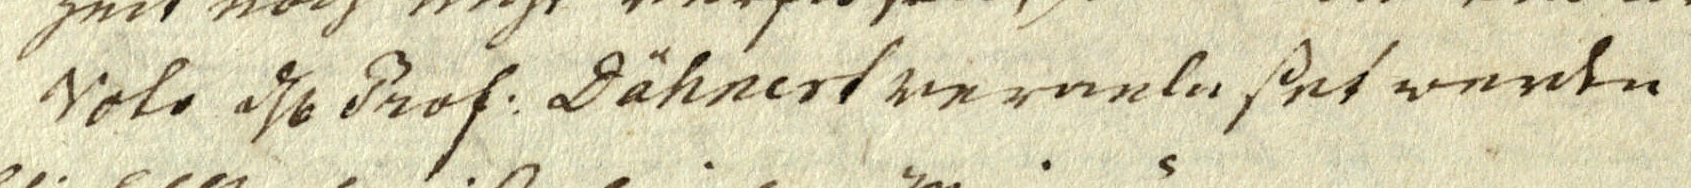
Voto dh Prof. Dähnert veranlaßet werden.
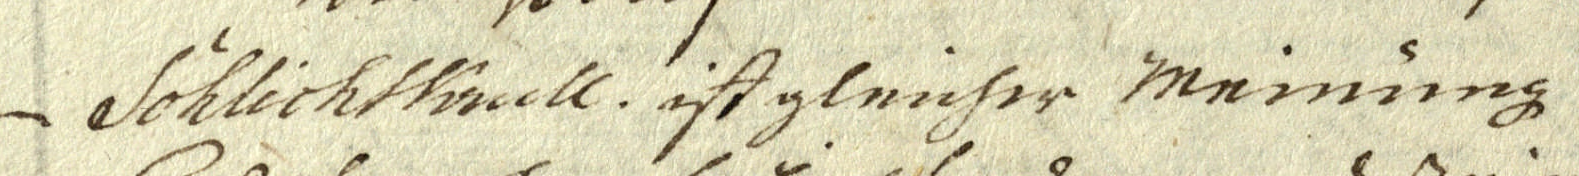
Schlichtkrull. ist gleicher Meinung
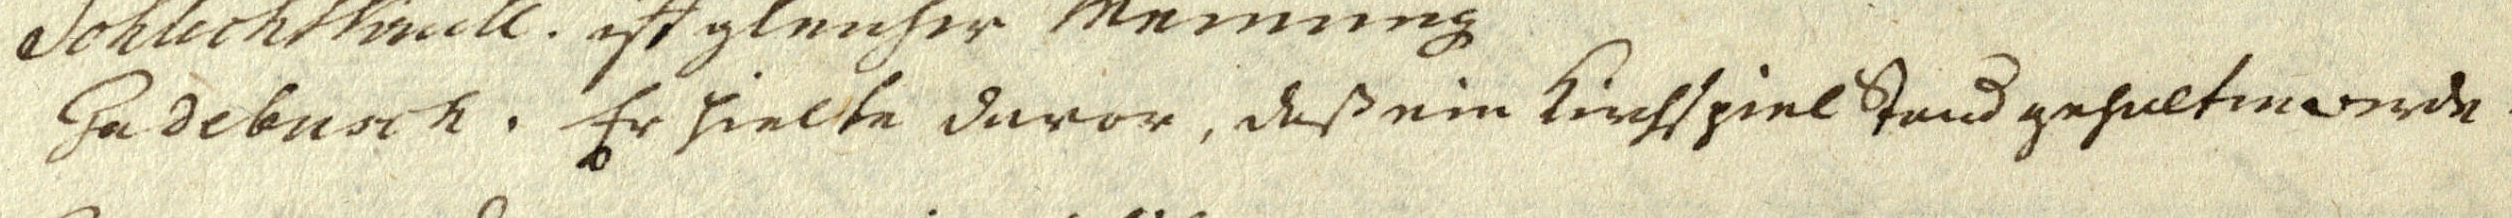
Gadebusch. Er hielte davor, daß ein KirchspielStand gehalten werde.
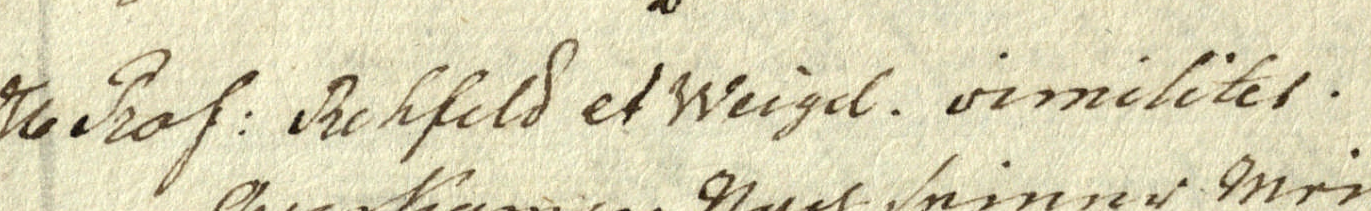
dh Prof. Rehfeld et Weigel. similiter.
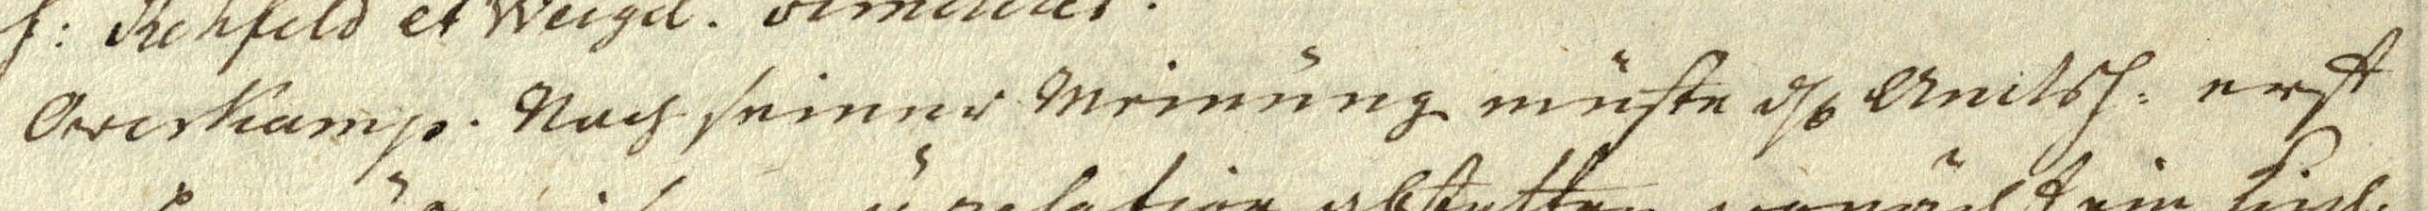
Overkamp. Nach seiner Meinung müste dh Amtsh. erst
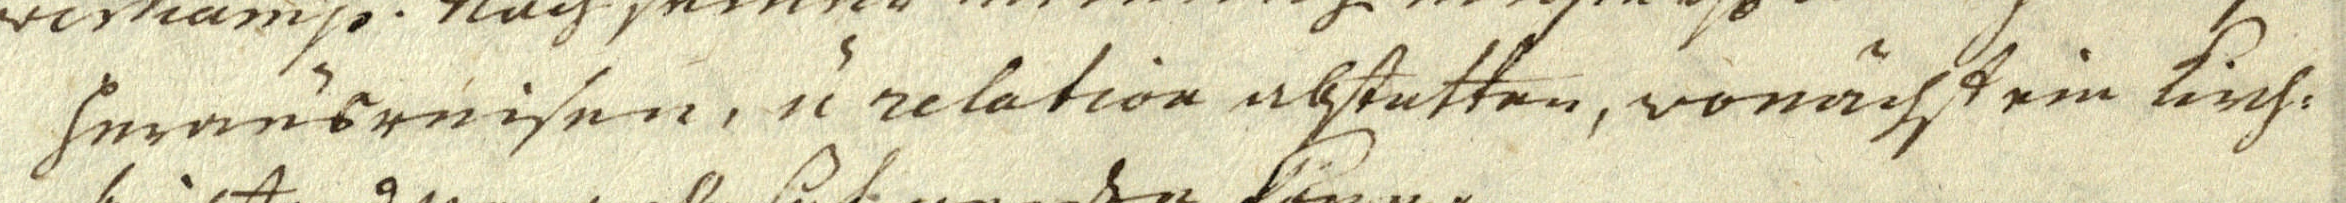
herausreisen, u relation abstatten, wonächt ein Kirch¬
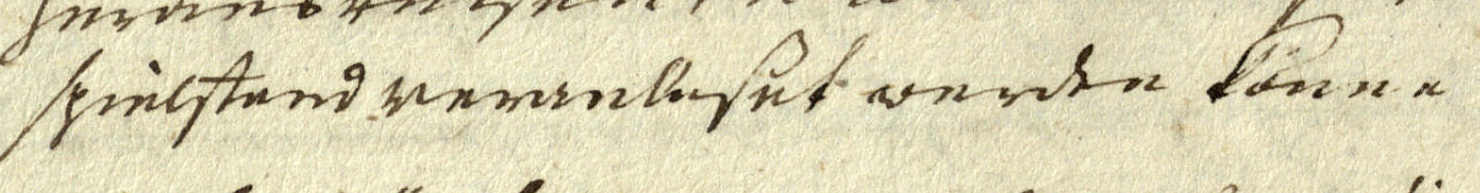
spielstand veranlaßet werden könne
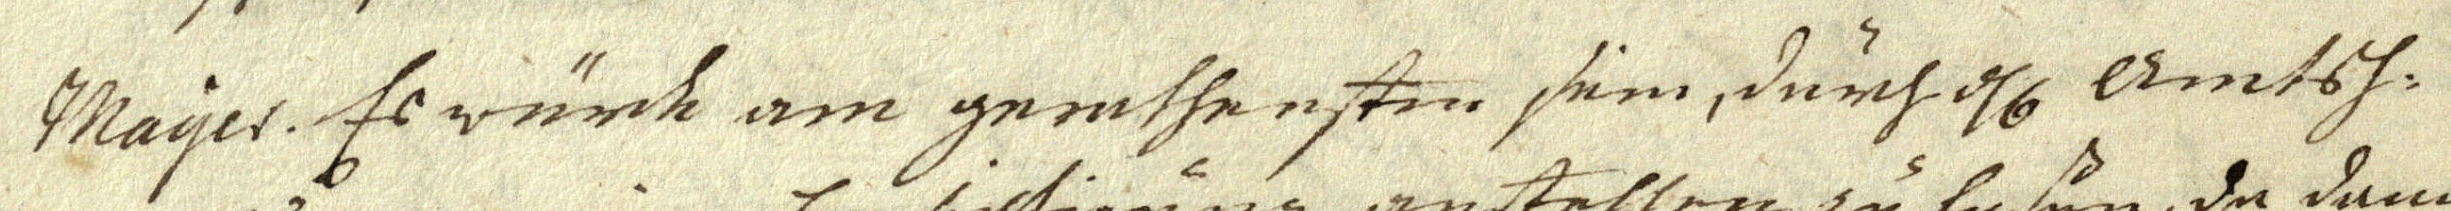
Maÿer. Es würde am gerathensten sein, durch dh Amtsh.
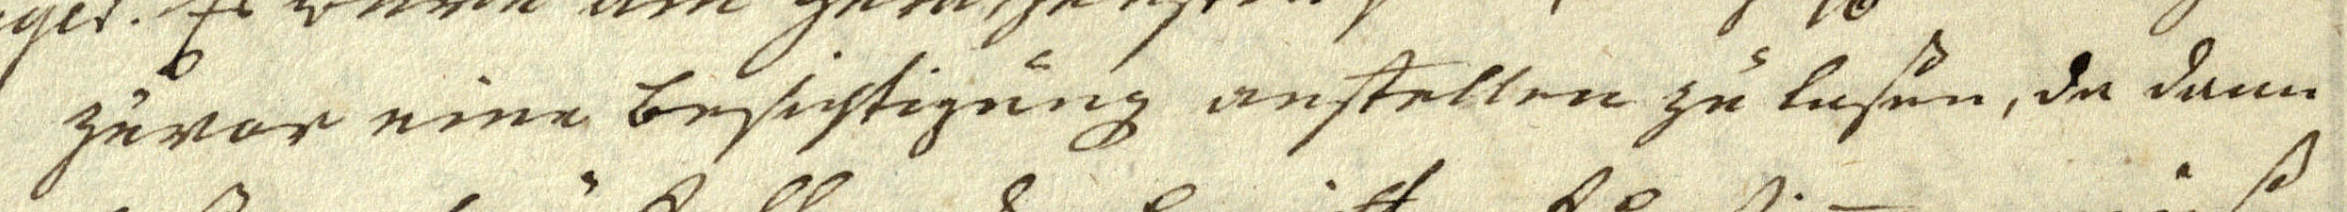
zuvor eine Besichtigung anstellen zu laßen, da dann
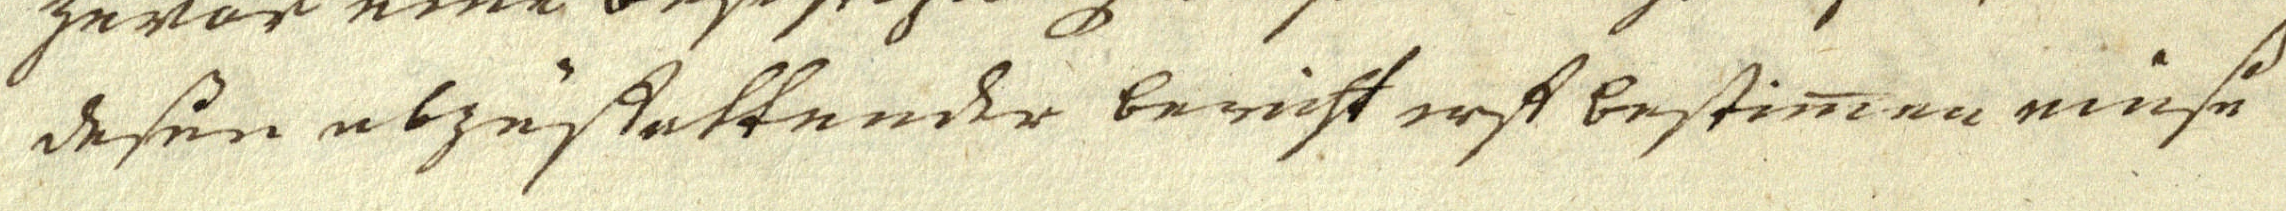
deßen abzustattender Bericht erst bestimen müße
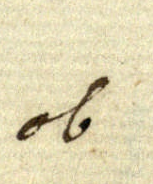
ob
